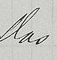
eine
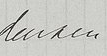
solche gar
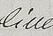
letztere
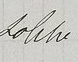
habe auch
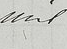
Weishaupt
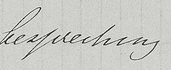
Besprechung
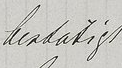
bestätigt.
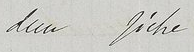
dem ziehe
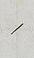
ich den
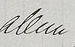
Schluss,
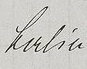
Sache
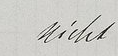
nicht
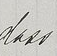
betrieben
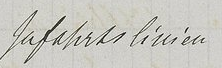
Zufahrtslinien
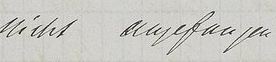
nicht angefangen werden
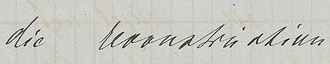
die Reconstruction
